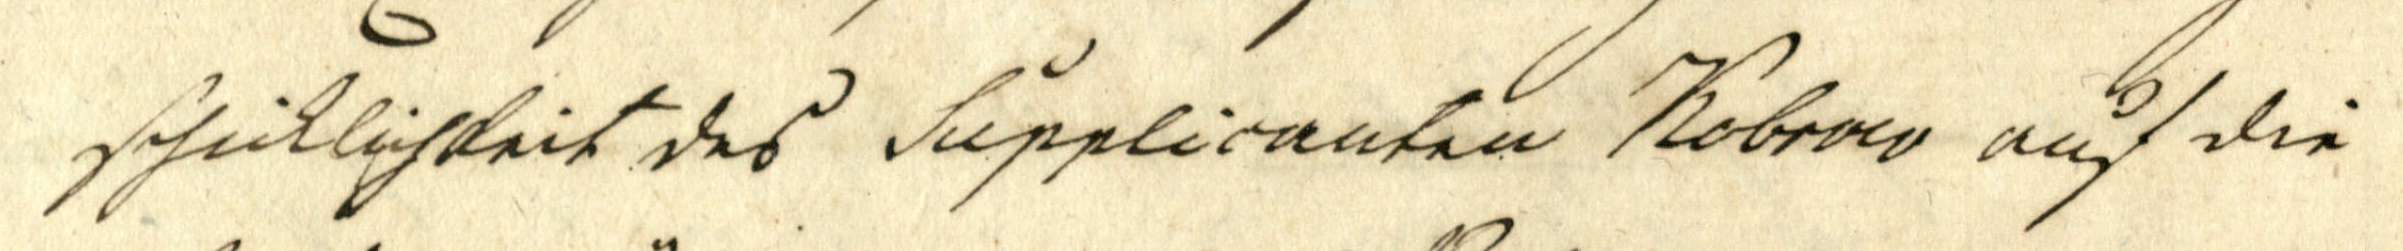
schicklichkeit des Supplicanten Kobrow auf die
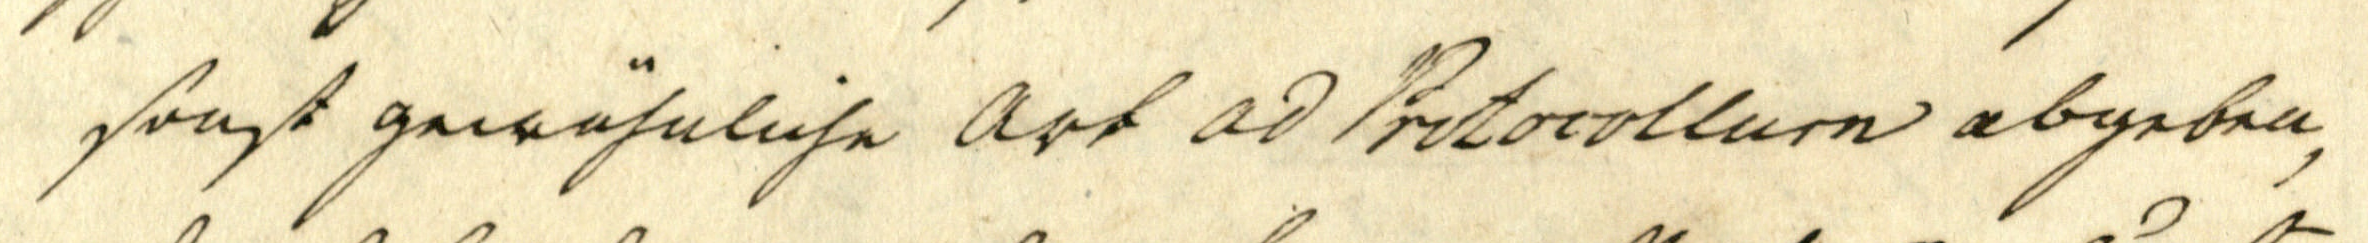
sonst gewöhnliche Art ad Protocollum abgeben,
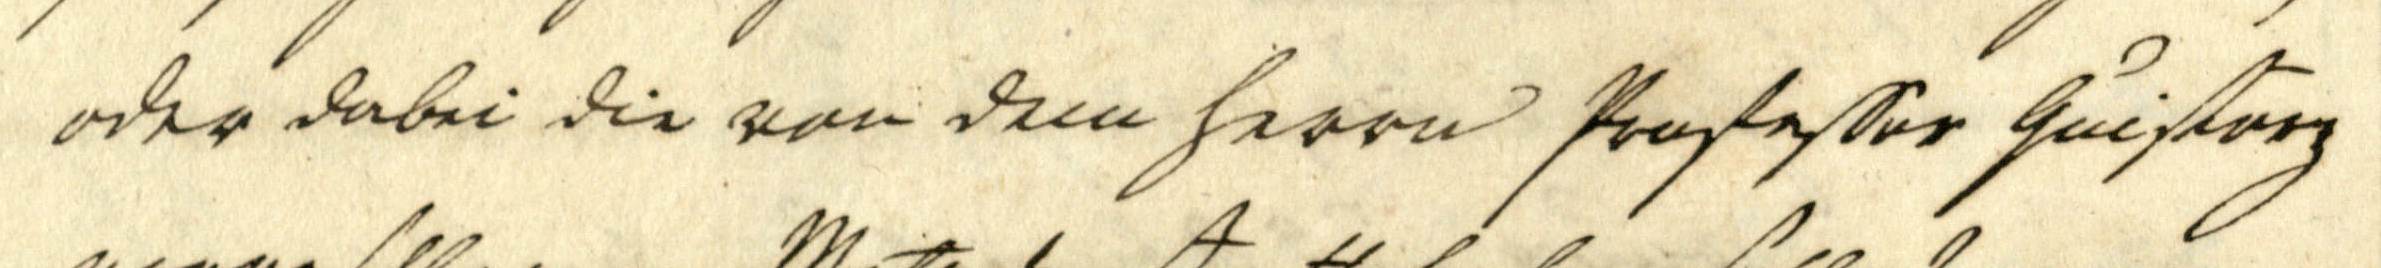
oder dabei die von dem Herrn Professor Quistorp
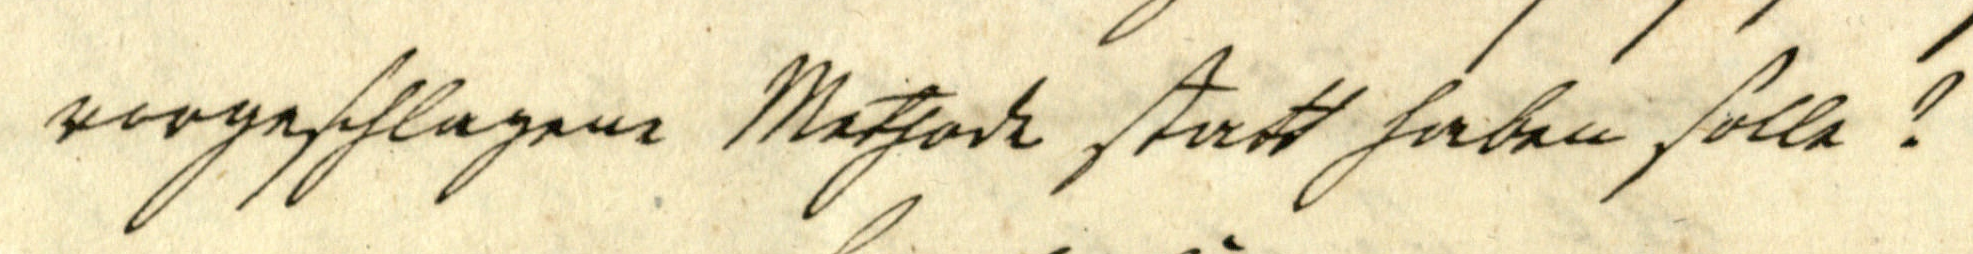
vorgeschlagene Methode statt haben solle?
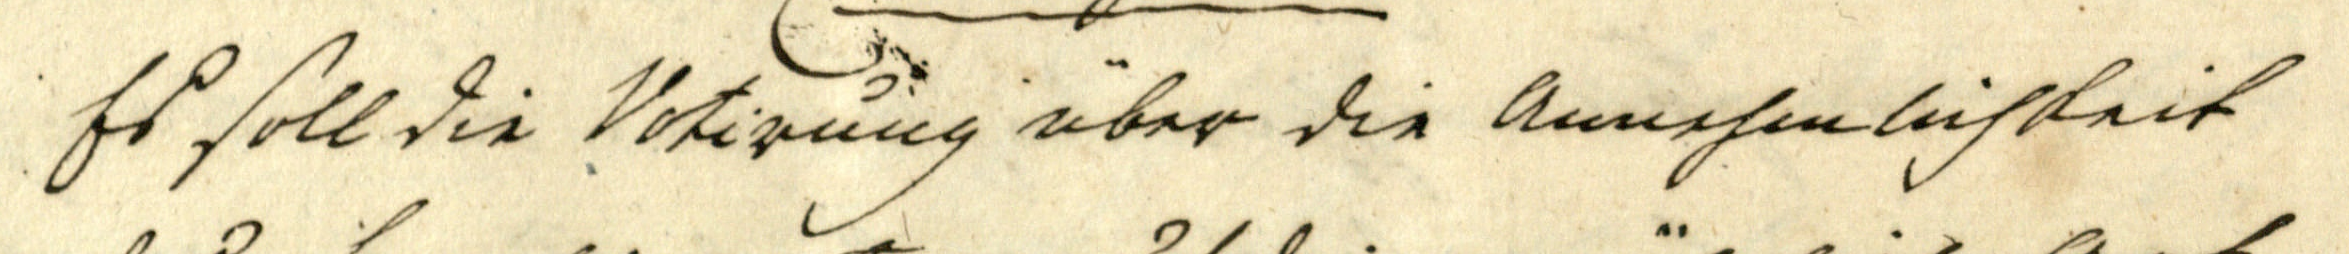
Es soll die Votirung über die Annehmlichkeit
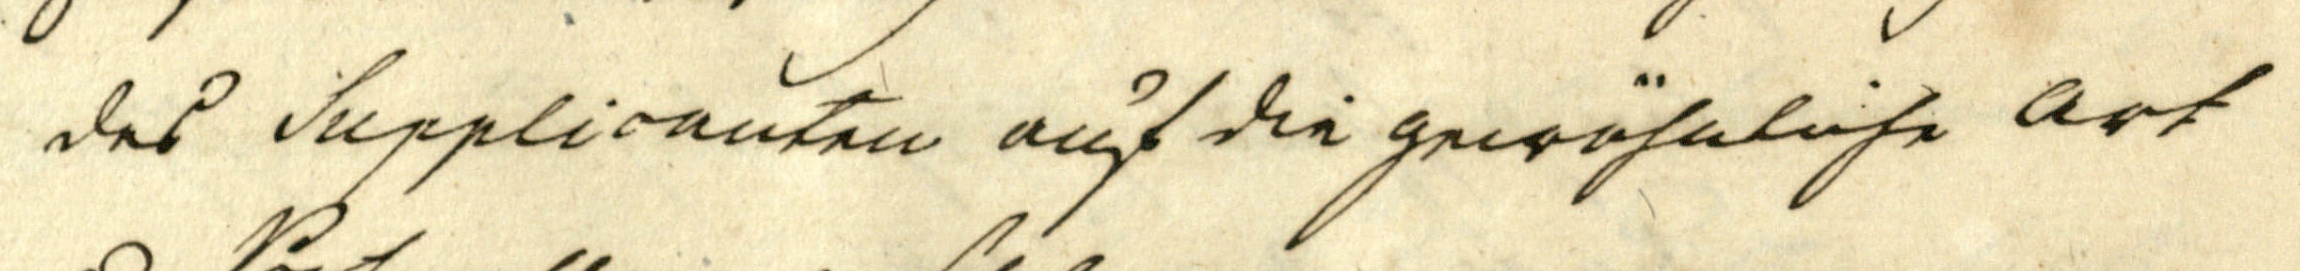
des Supplicanten auf die gewöhnliche Art
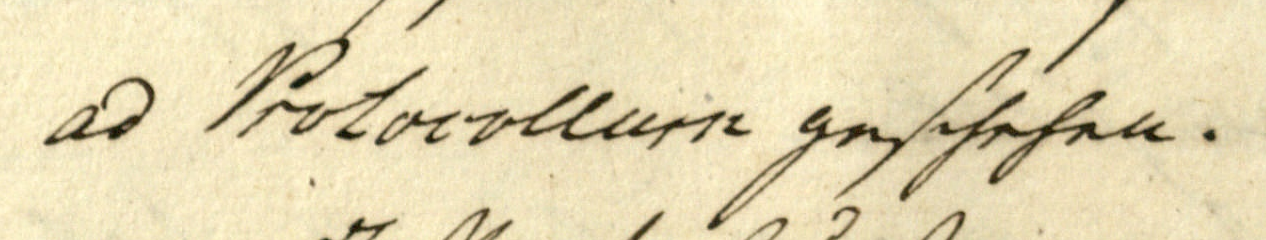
ad Protocollum geschehen.
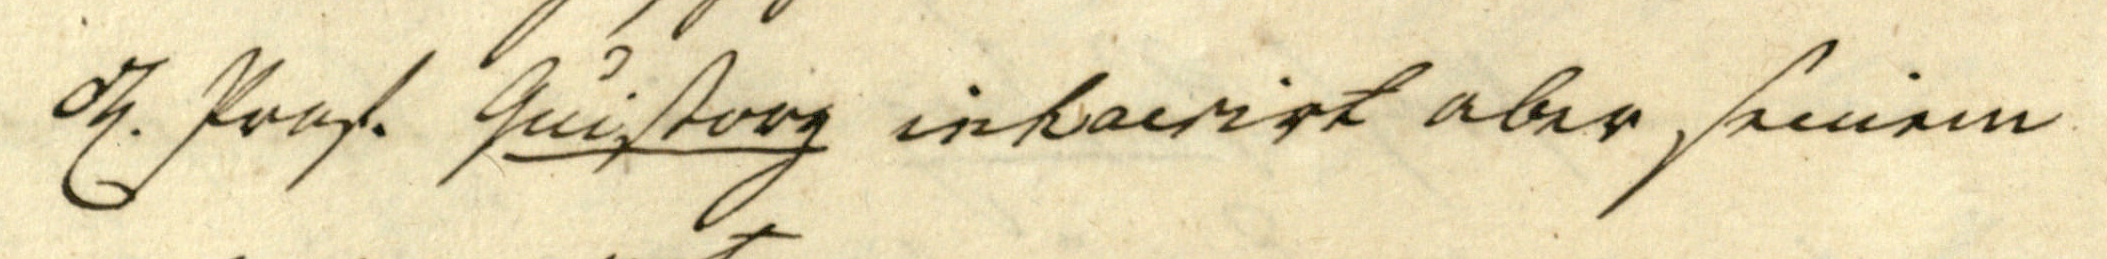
dh. Prof. Quistorp inhaerirt aber seinem
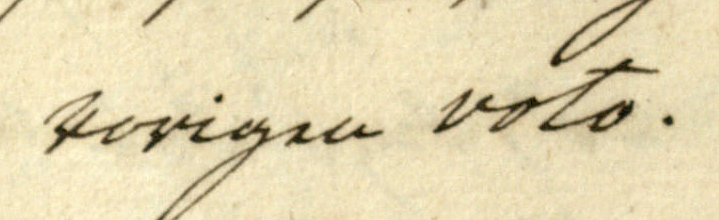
vorigen voto.
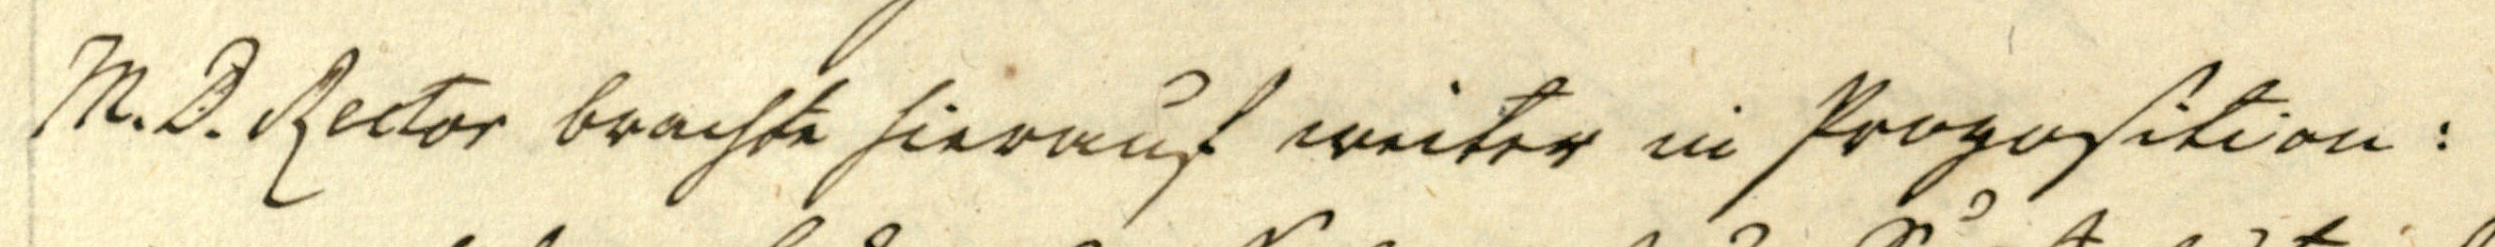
M. D. Rector brachte hierauf weiter in Proposition:
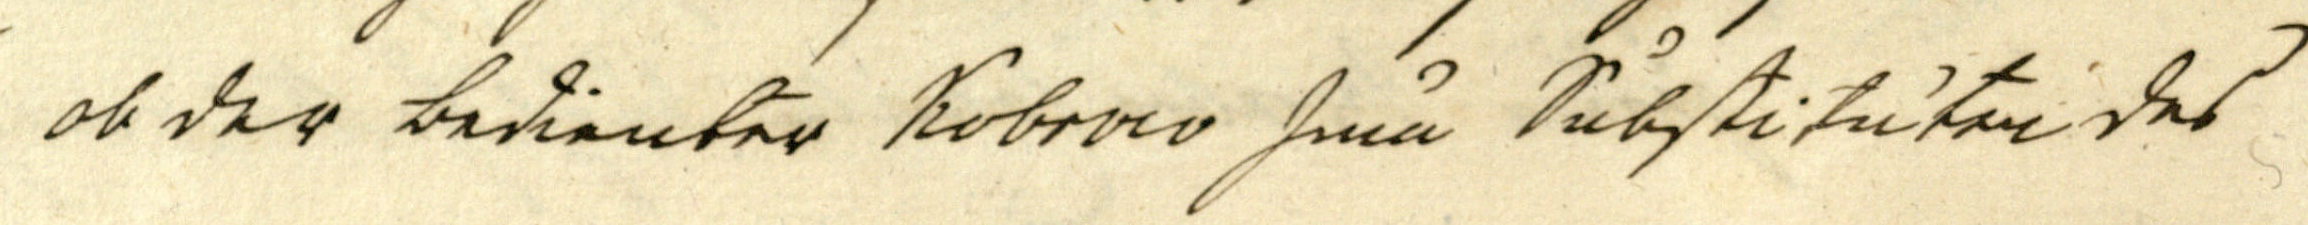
ob der Bedienter Kobrow zum Substituten des
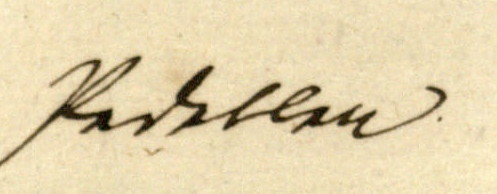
Pedellen
